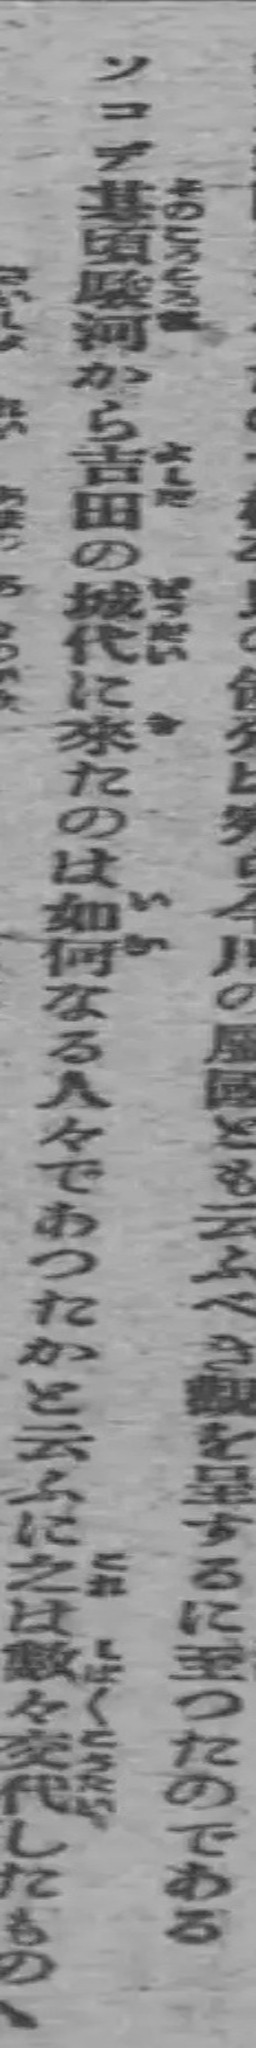ソコデ其頃駿河から吉田の城代に来たのは如何なる人々であつたかと云ふに之は屡々交代したものゝ
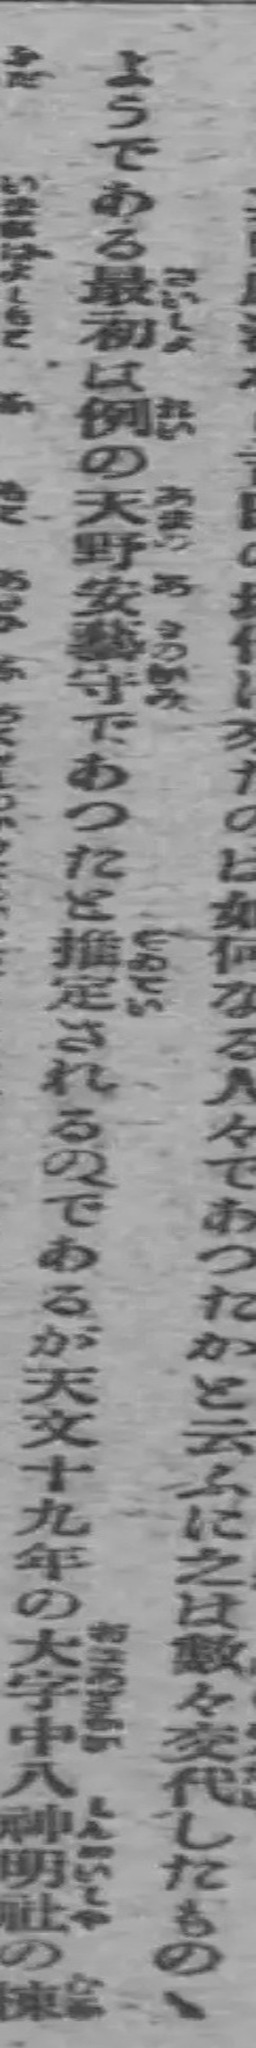ようである最初は例の天野安芸守であつたと推定されるのであるが天文十九年の大字中八神明社の棟
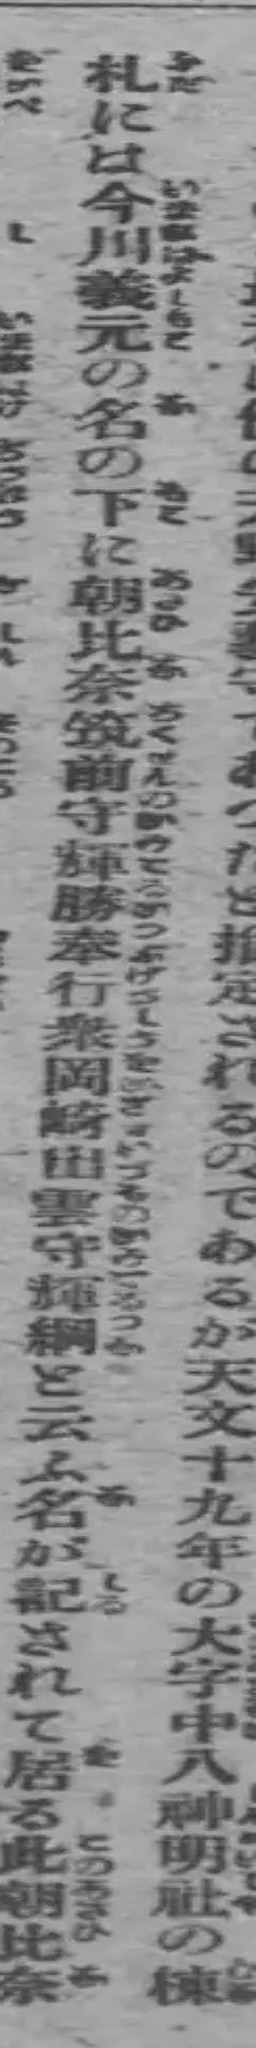吉田城代札には今川義元の名の下に朝比奈筑前守輝勝奉行衆岡崎出雲守輝綱と云ふ名が記されて居る此朝比奈
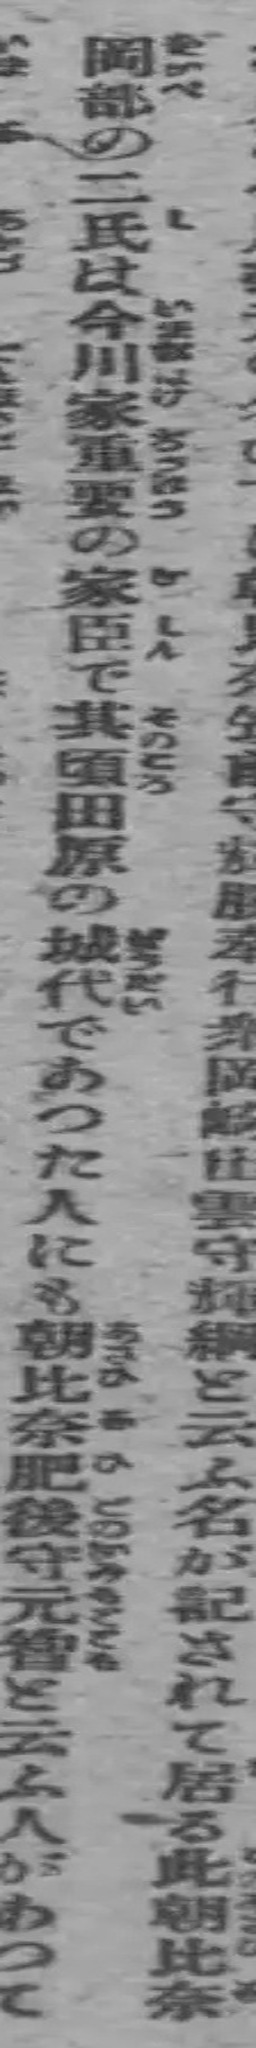岡部の二氏は今川家重要の家臣で其頃田原の城代であつた人にも朝比奈肥後守元智と云ふ人があつて
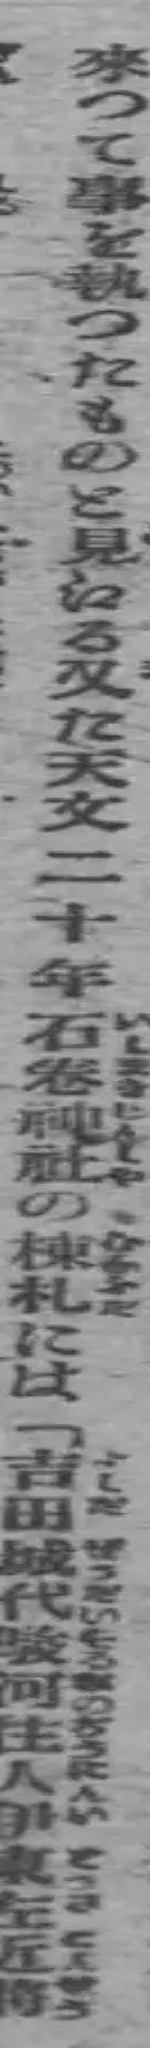来つて事を執つたものと見える又た天文二十年石巻神社の棟札には「吉田城代駿河住人伊東左近将
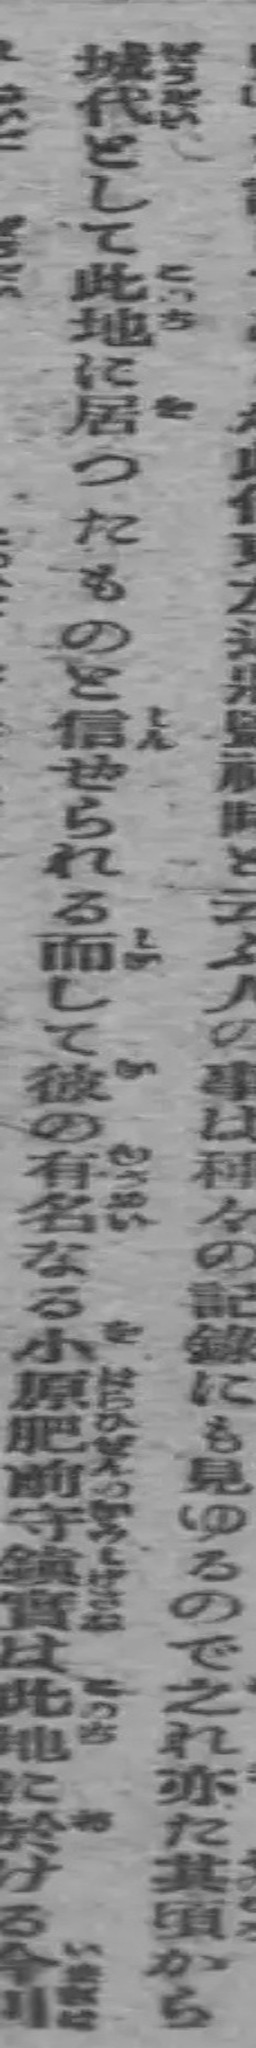城代として此地に居つたものと信ぜられる而して彼の有名なる小原肥前守鎮実は此地に於ける今川
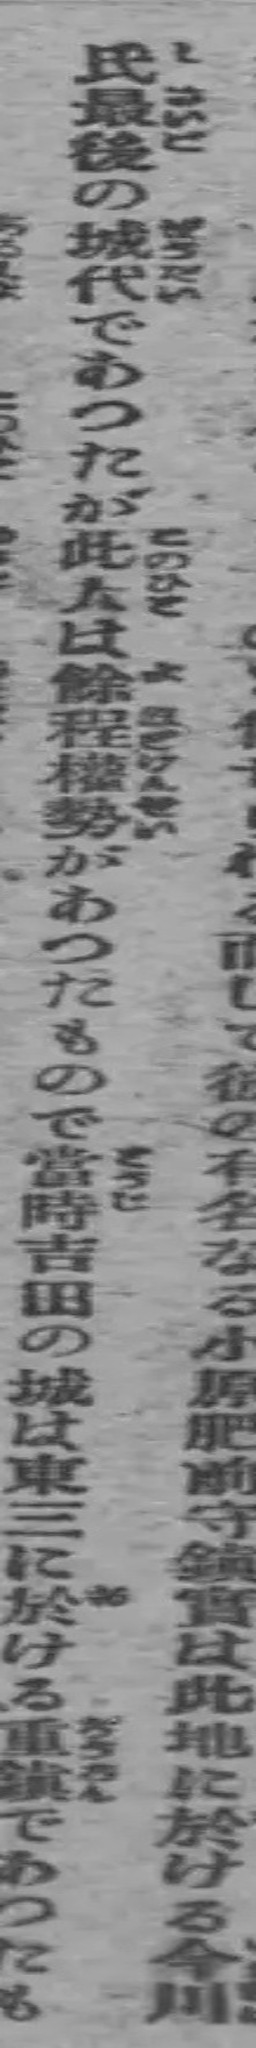小原肥前守氏最後の城代であつたが此人は余程権勢があつたもので当時吉田の城は東三に於ける重鎮であつたも
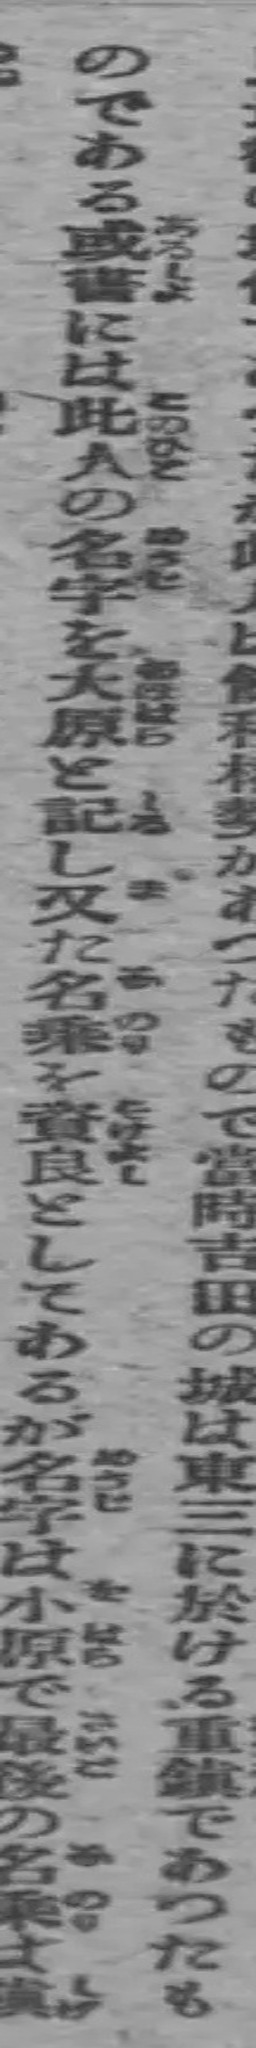のである或書には此人の名字を大原と記し又た名乗を資良としてあるが名字は小原で最後の名乗は鎮
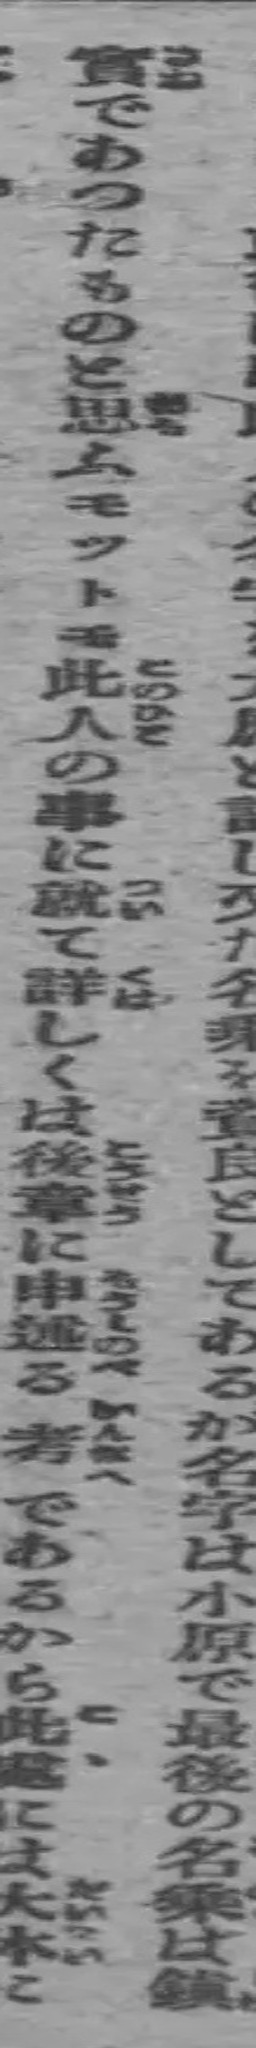実であつたものと思ふモツトモ此人の事に就て詳しくは後章に申述る考へであるから此処には大体に
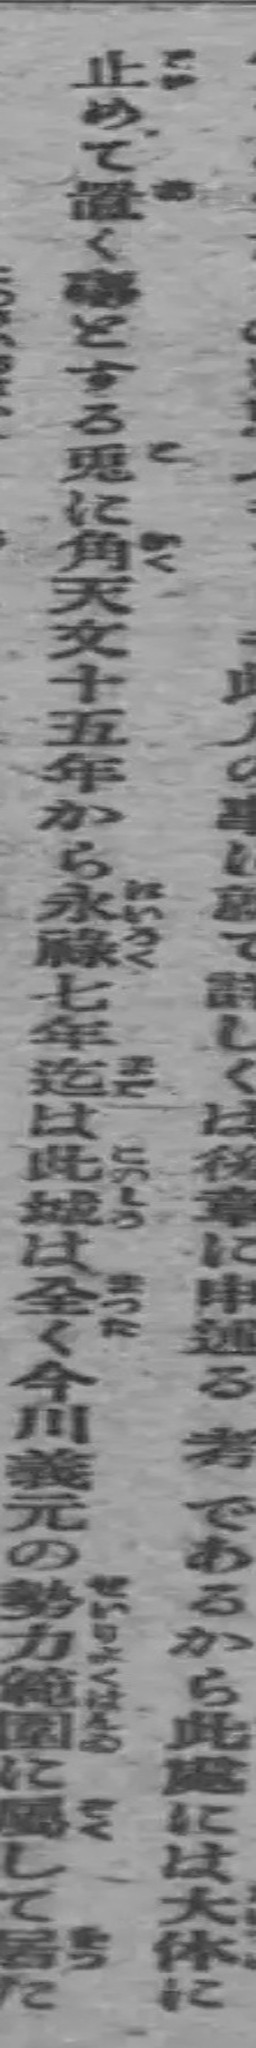止めて置く事とする兎に角天文十五年から永禄七年迄は此城は全く今川義元の勢力範囲に属して居た
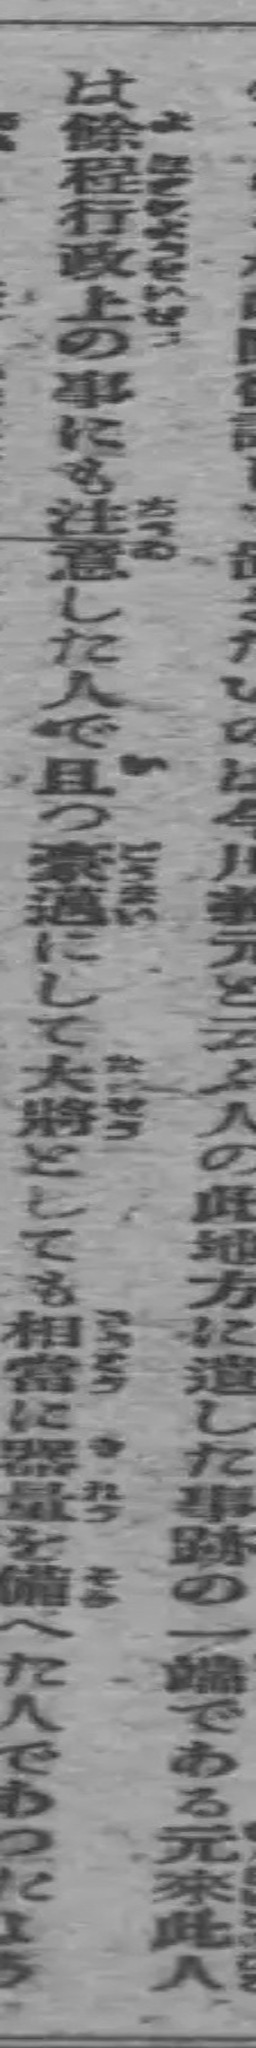は余程行政上の事にも注意した人で且つ豪邁にして大将としても相当に器量を備へた人であつたよう
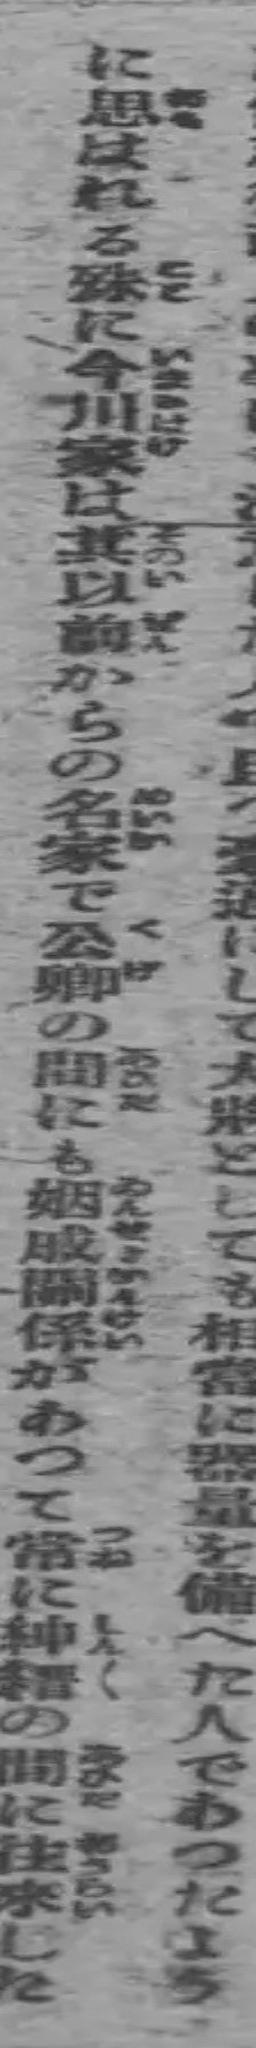に思はれる殊に今川家は其以前からの名家で公卿の間にも姻戚関係があつて常に紳縉の間に往来した
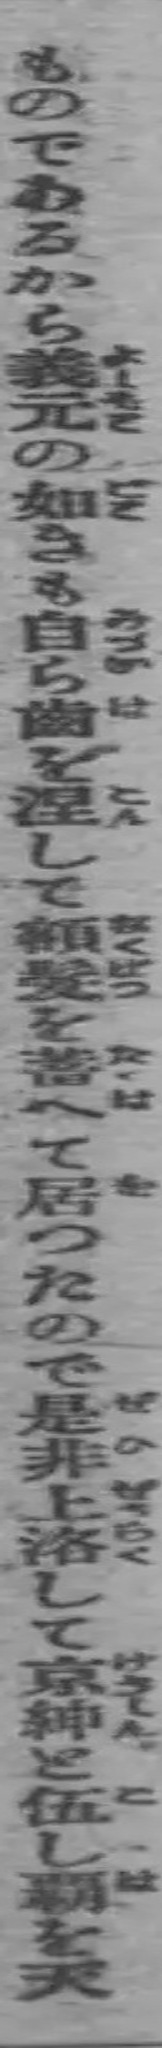ものであるから義元の如きも自ら歯を涅して額髪を蓄へて居つたので是非上洛して京紳と伍し覇を天
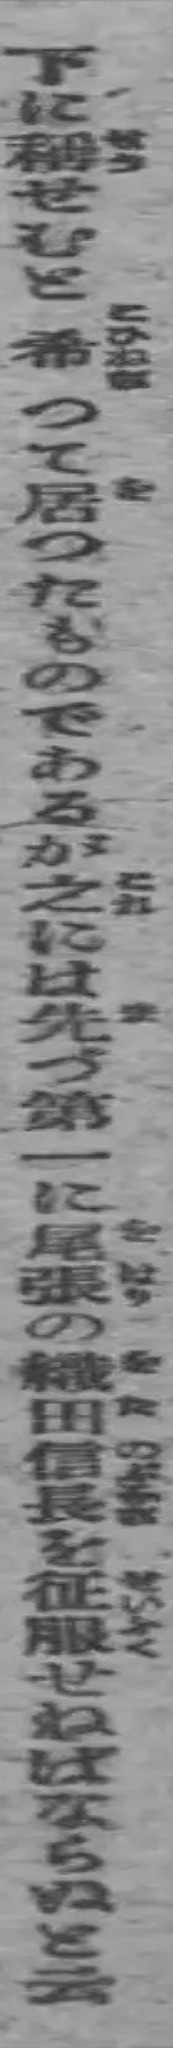下に称せむと希つて居つたものであるが之には先づ第一に尾張の織田信長を征服せねばならぬと云
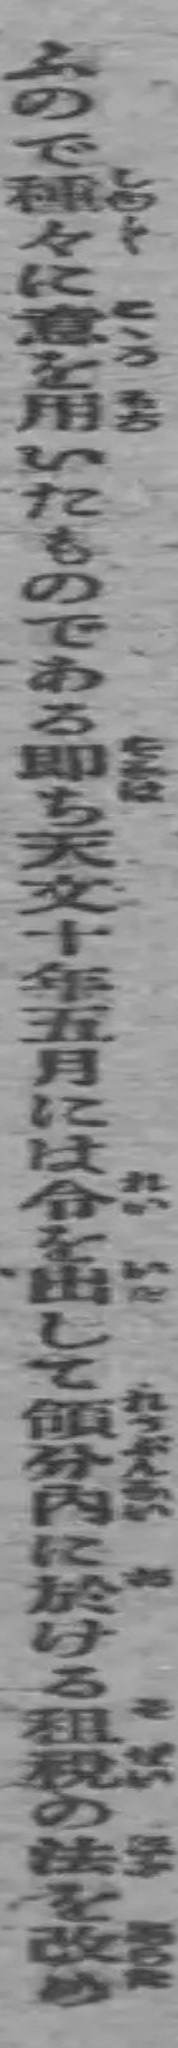ふので種々に意を用いたものである即ち天文十年五月には令を出して領分内に於ける租税の法を改め
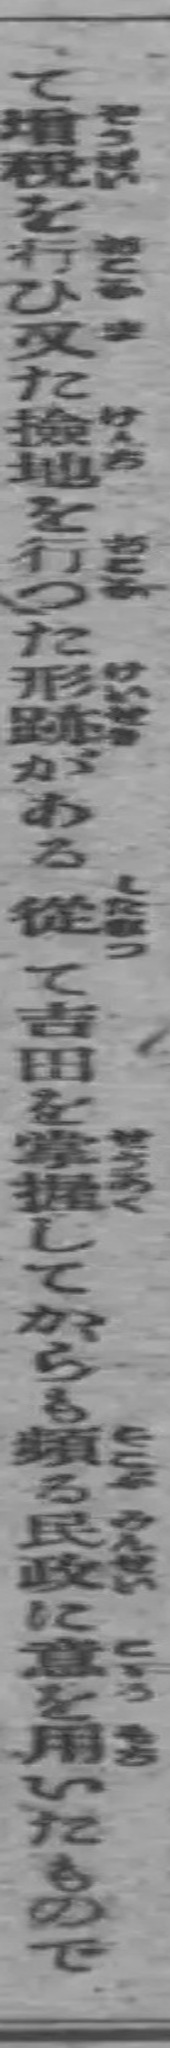て増税を行ひ又た撿地を行つた形跡がある従て吉田を掌握してからも頗る民政に意を用いたもので
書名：豊橋市史談
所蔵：国立国会図書館 National Diet Library, JAPAN
